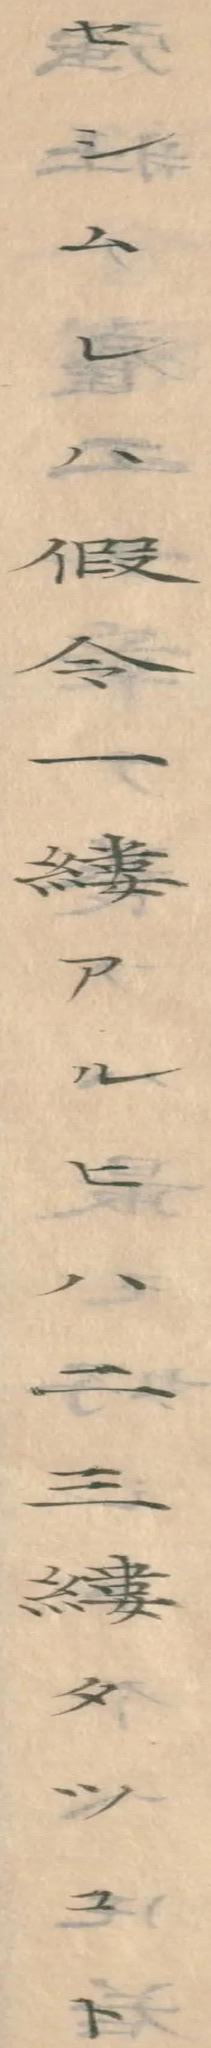セシムレハ仮令一縷アルヒハ二三縷タツコト
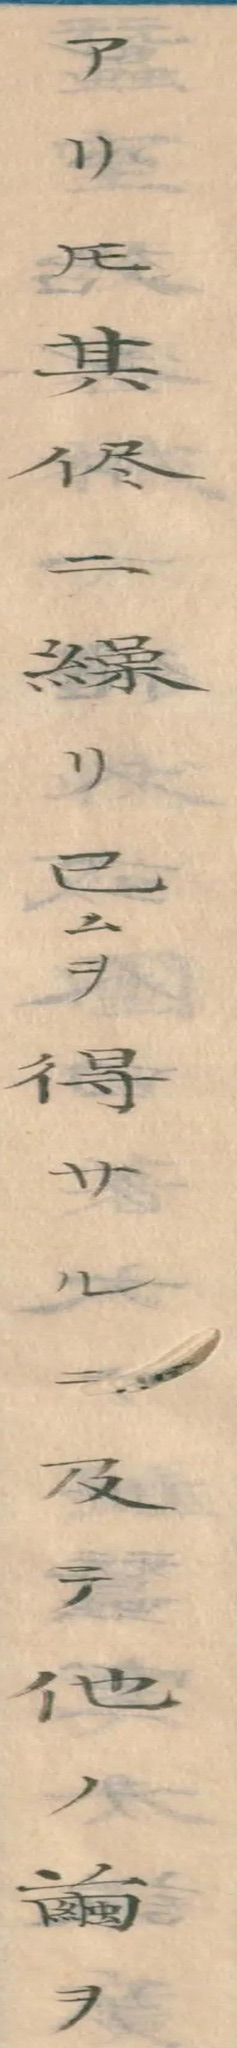アリトモ其侭ニ繰リ已ムヲ得サルニ及テ他ノ繭ヲ
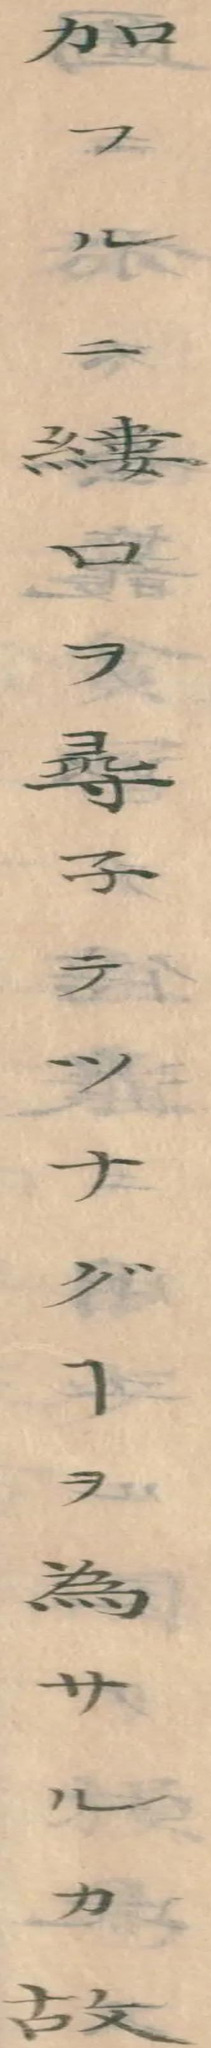加フルニ縷口ヲ尋ネテツナグコトヲ為サルカ故
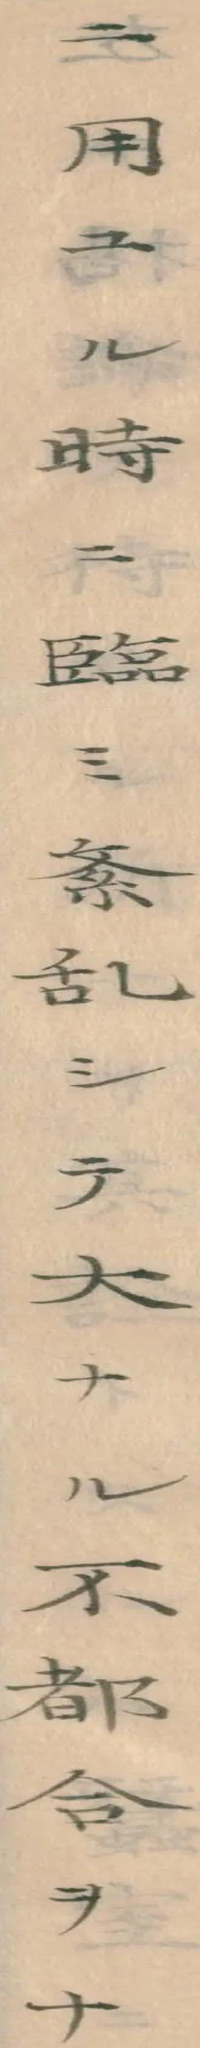ニ用ユル時ニ臨ミ紊乱シテ大ナル不都合ヲナ
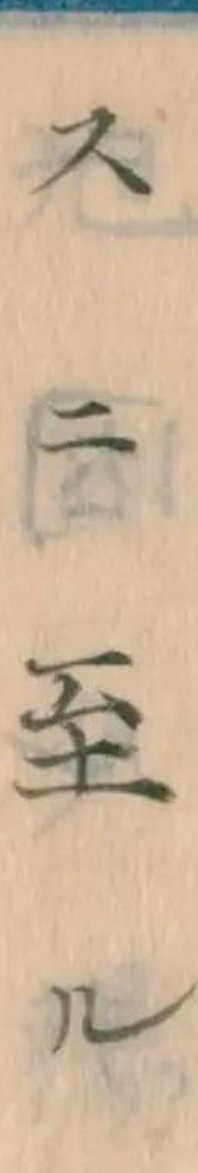スニ至ル
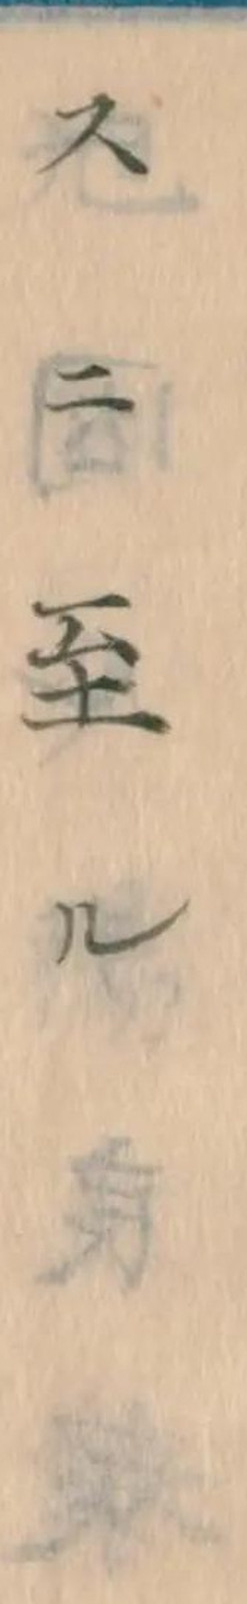スニ至ル
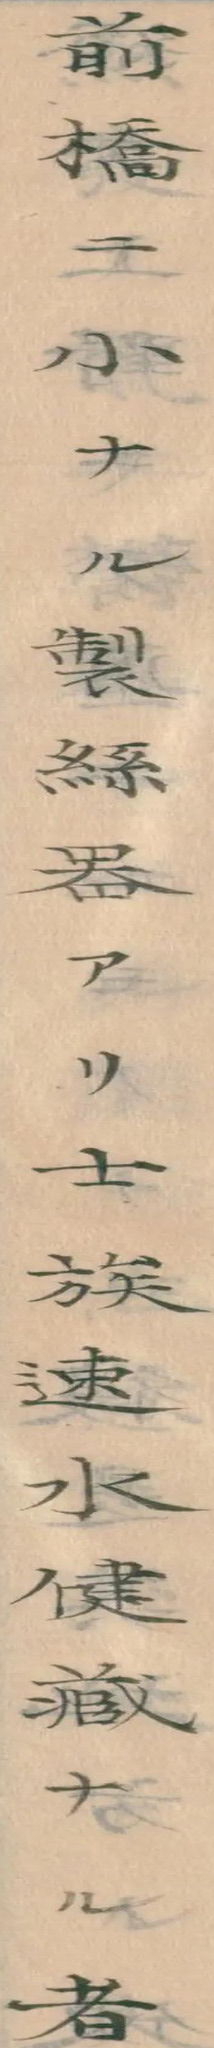前橋ニ小ナル製糸器アリ士族速水健蔵ナル者
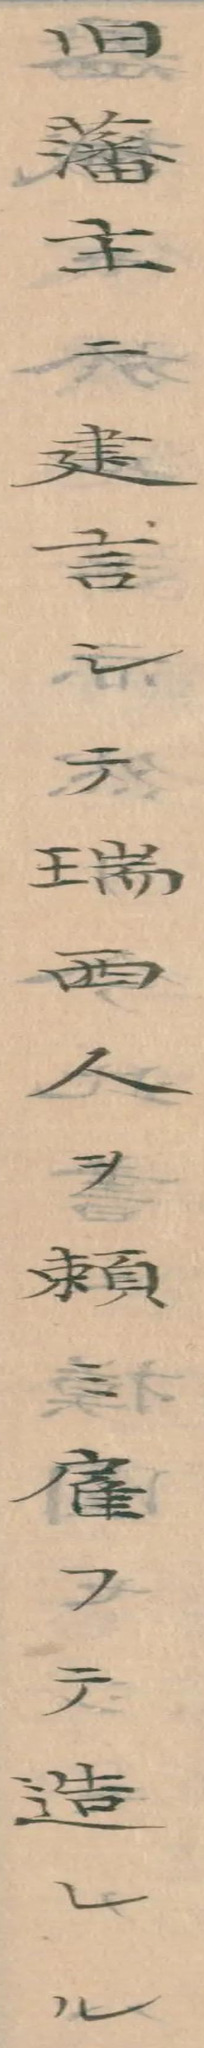旧藩主ニ建言シテ瑞西人ヲ頼ミ雇フテ造レル
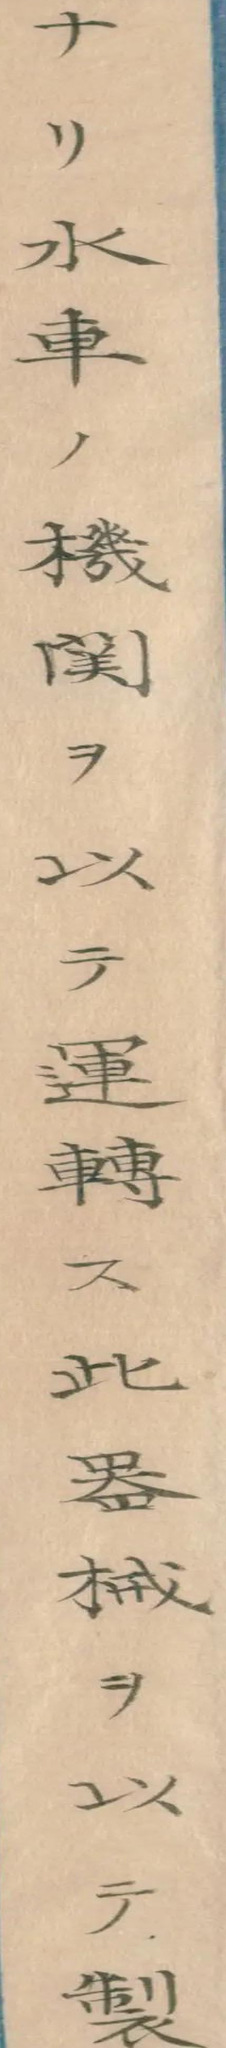ナリ水車ノ機関ヲ以テ運転ス此器械ヲ以テ製
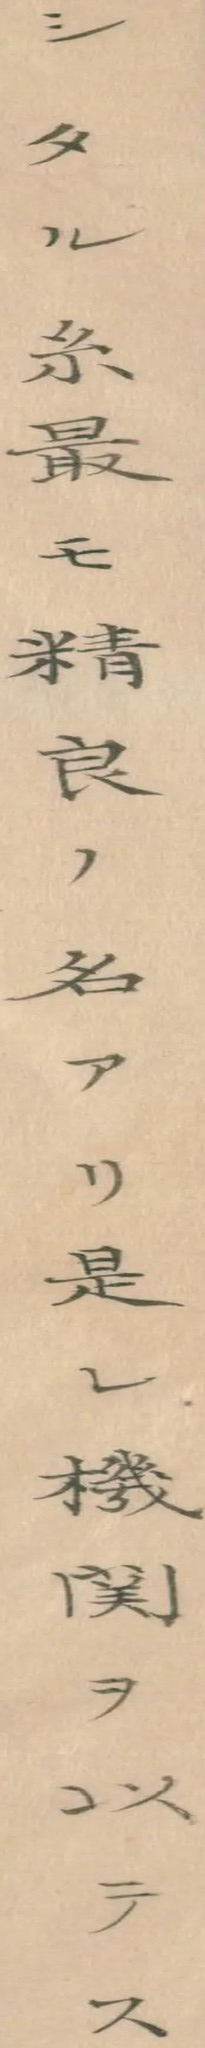シタル糸最モ精良ノ名アリ是レ機関ヲ以テス
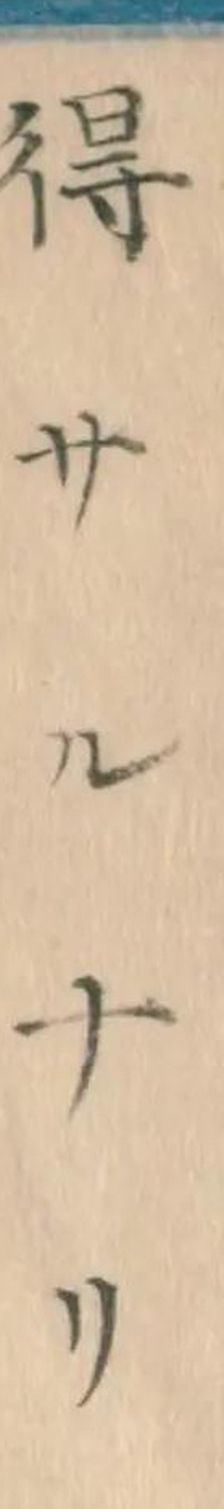得サルナリ
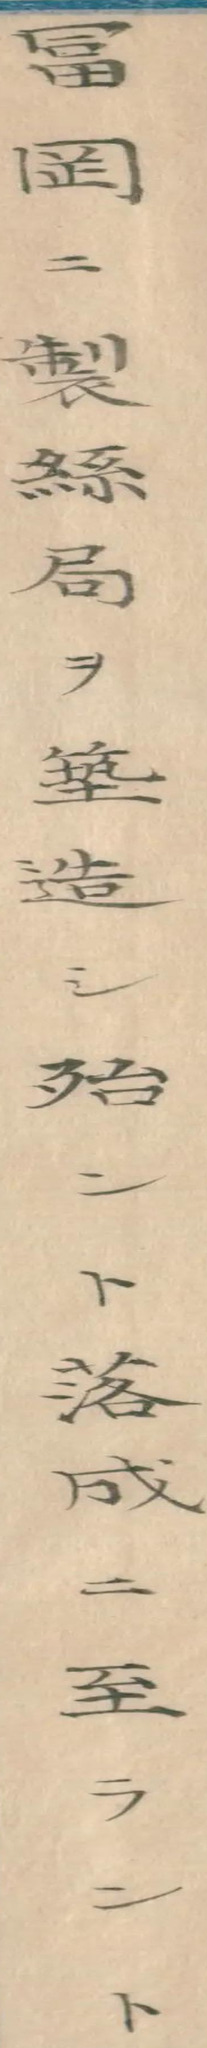富岡ニ製糸局ヲ築造シ殆ント落成ニ至ラント
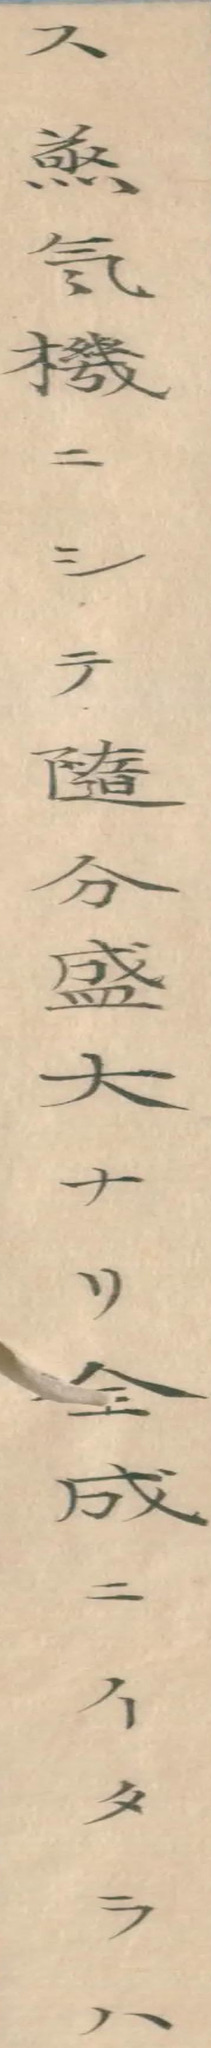ス蒸気機ニシテ随分盛大ナリ全成ニイタラハ
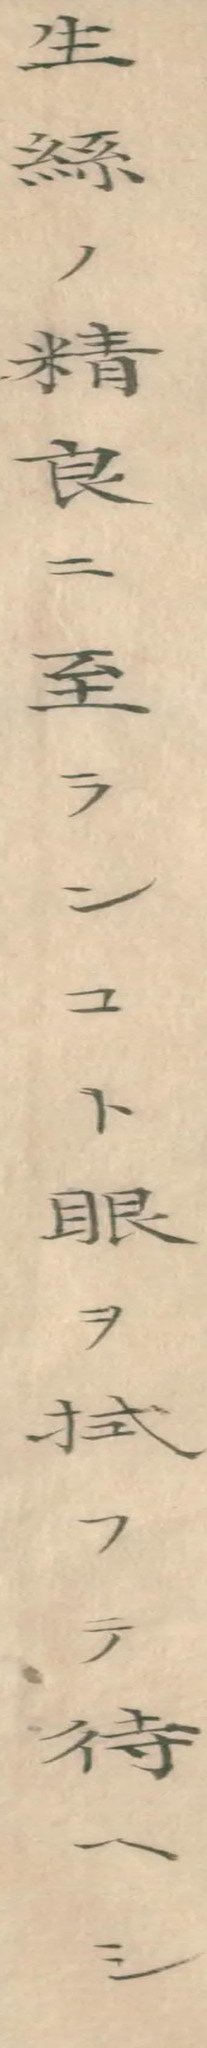生糸ノ精良ニ至ランコト眼ヲ拭フテ待ヘシ
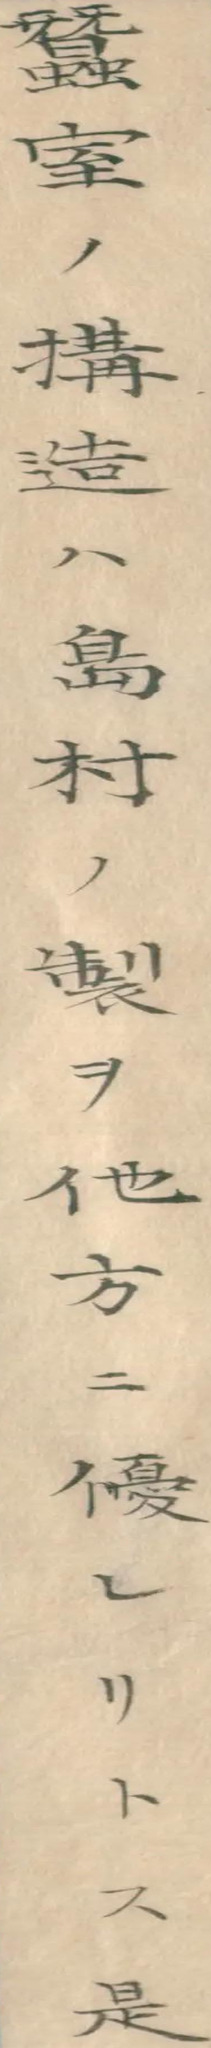蚕室ノ搆造ハ島村ノ製ヲ他方ニ優レリトス是
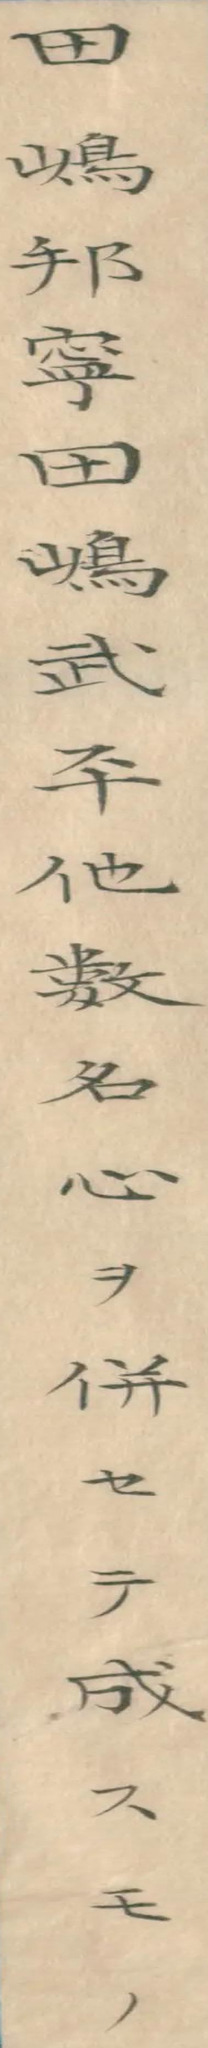田嶋邦寧田嶋武平他数名心ヲ併セテ成スモノ
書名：蚕桑集成
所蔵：国立国会図書館 National Diet Library, JAPAN
